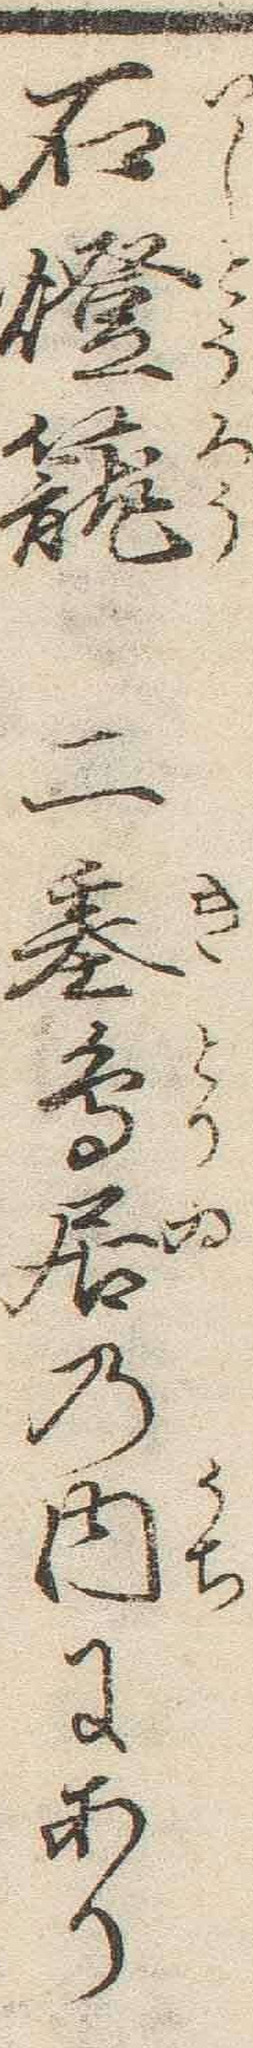石燈籠二基鳥居の内にあり
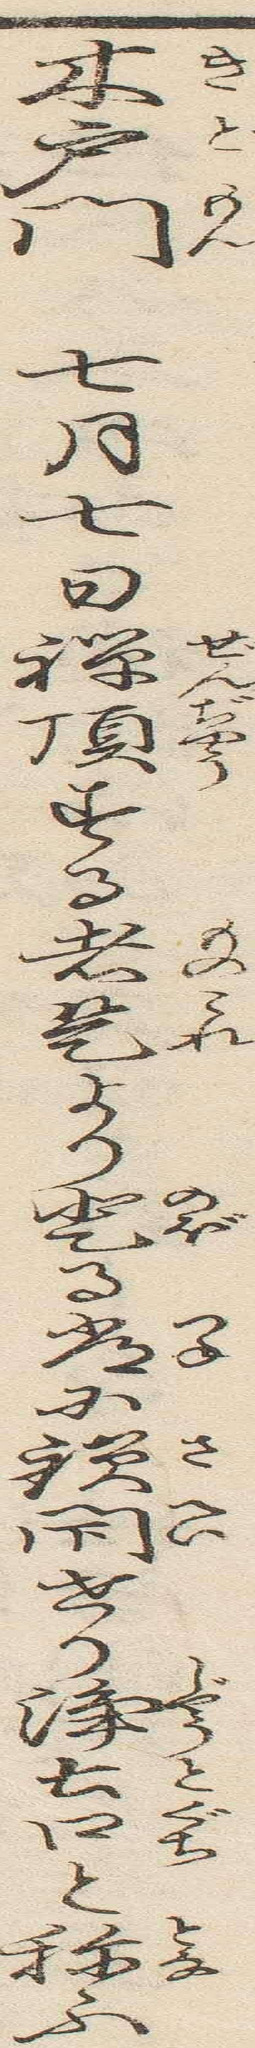木戸門七月七日禅頂する者是より登る常に鎖閇せり浄土口と称ふ
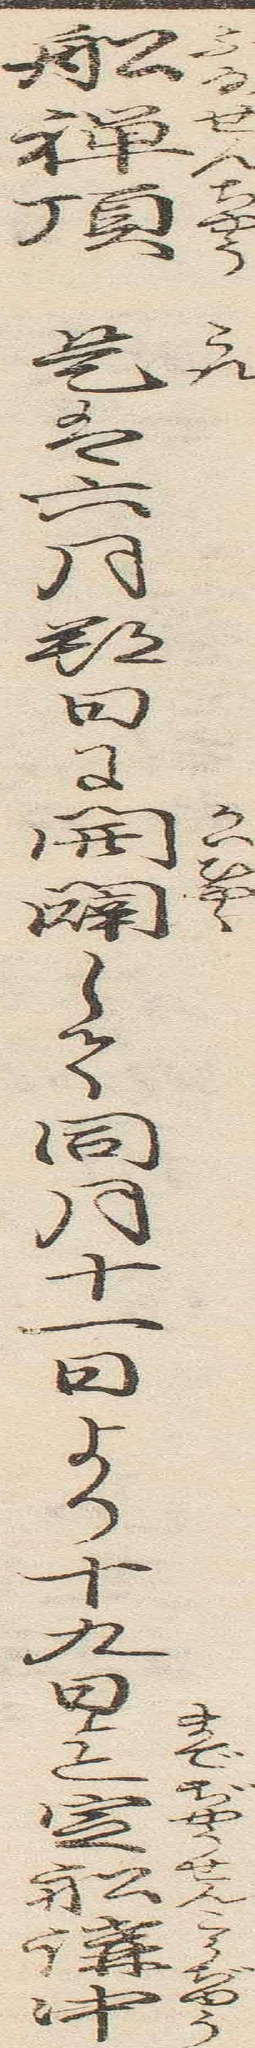舩禅頂是は六月朔日に開闢して同月十一日より十九日迄定舩講中
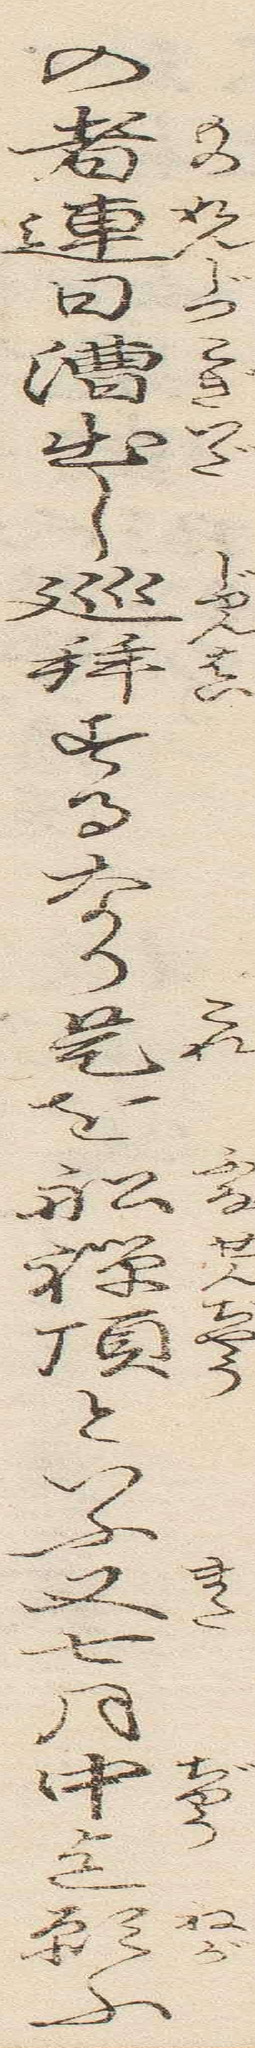の者連日漕出し廵拜するなり是を舩禅頂といふ又七月中迄願ふ
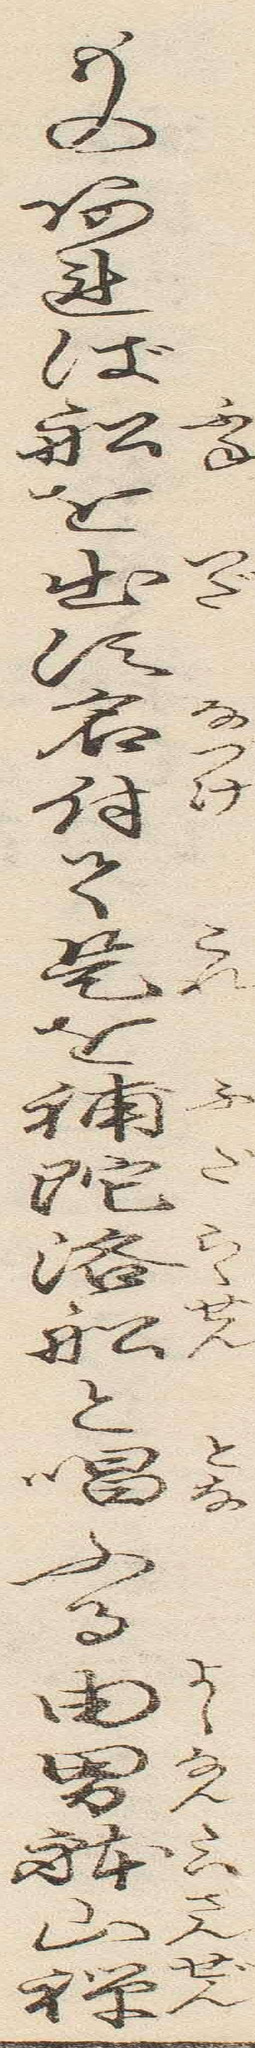ものあれば舩を出す名附て是を補陀洛舩と唱ふる由男躰山禅
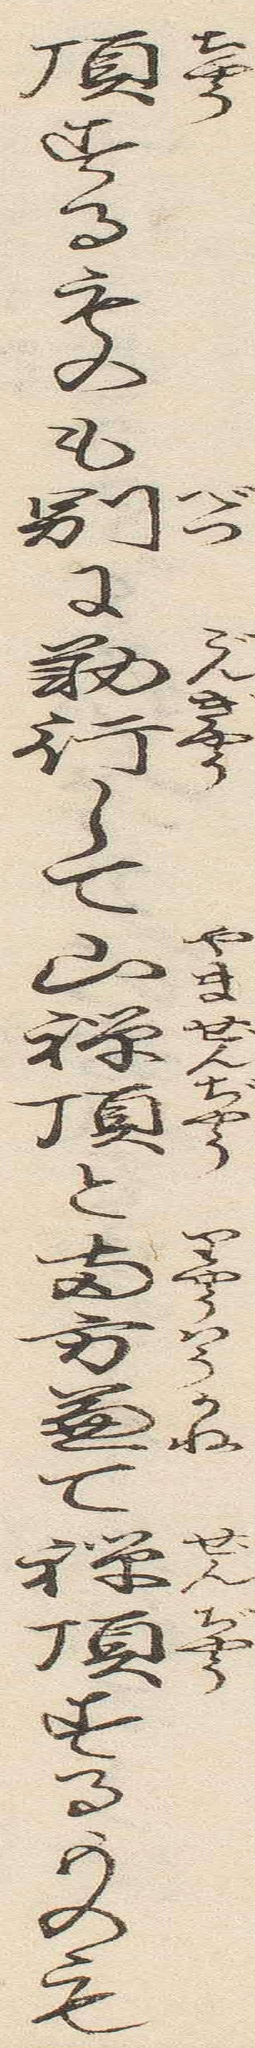頂するものも別に勤行して山禅頂と両方兼て禅頂するものも
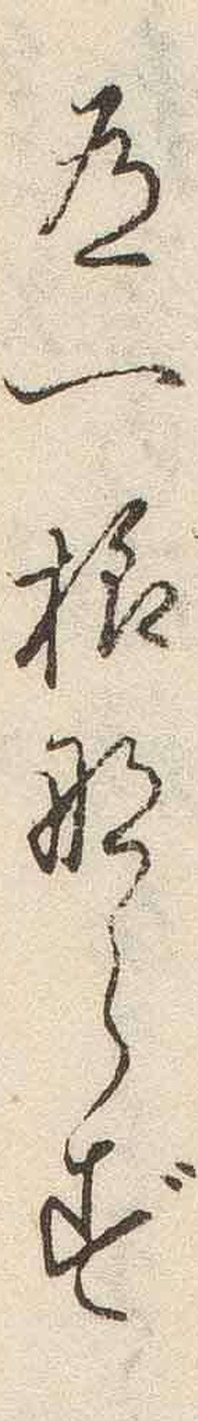有一様ならず
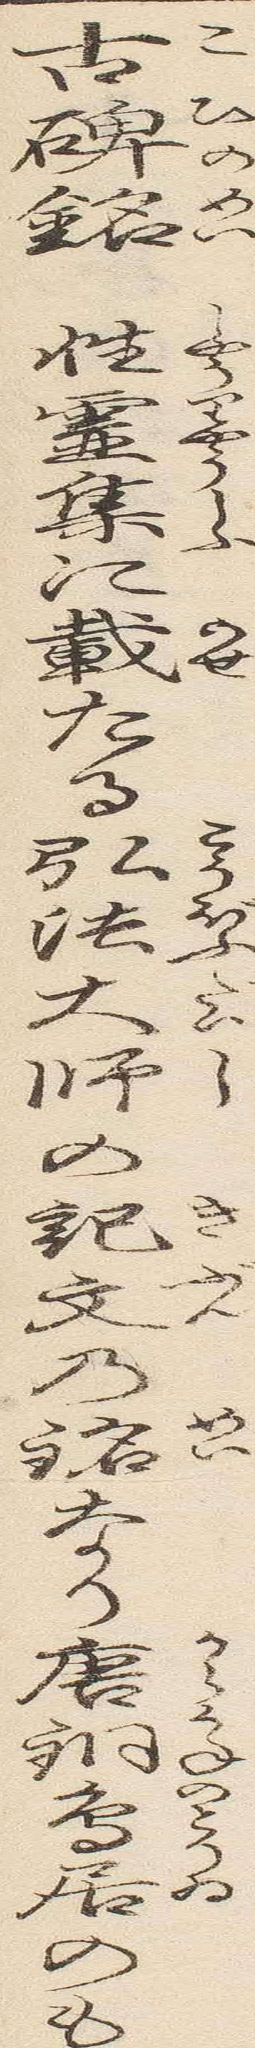古碑銘性霊集に載たる弘法大師の記文の銘なり唐銅鳥居のも
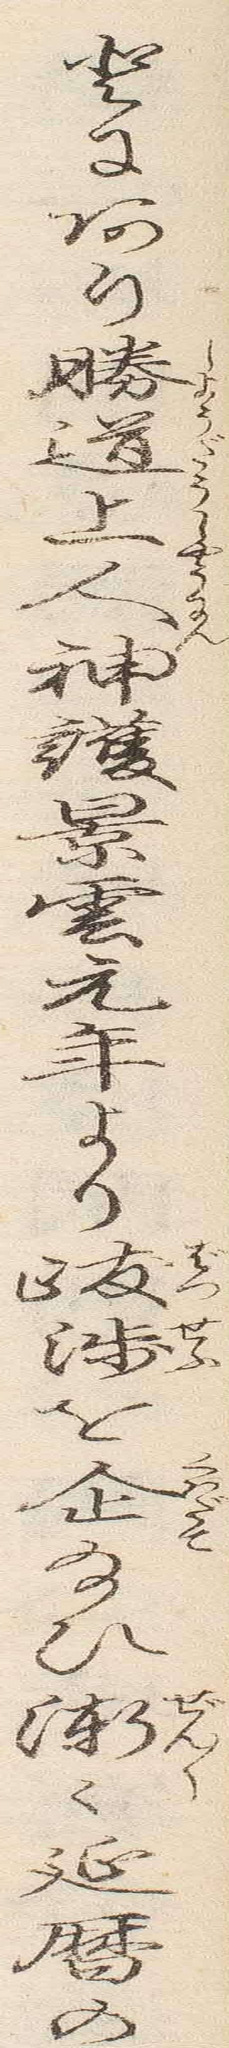とにあり勝道上人神護景雲元年より跋渉を企給ひ漸〻延暦の
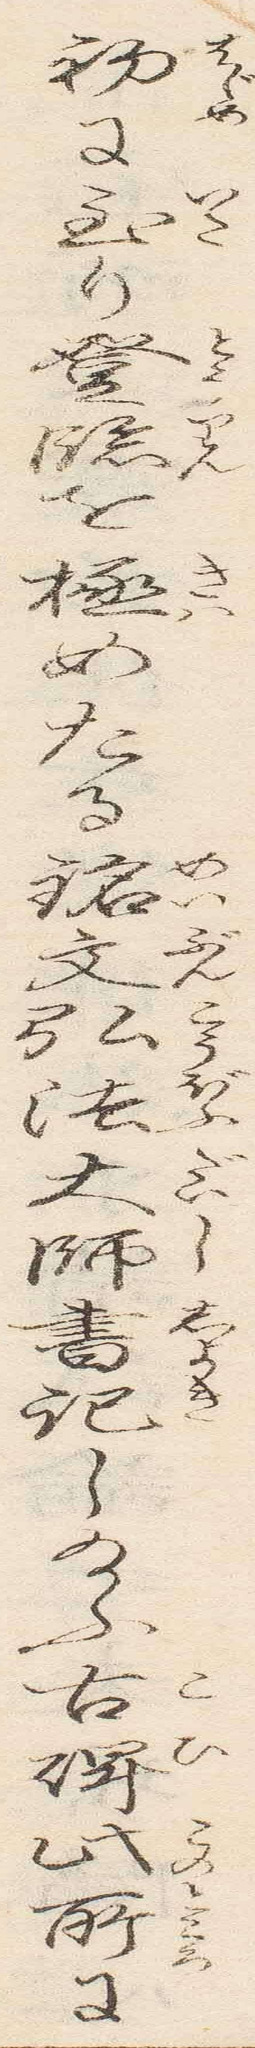初に至り登臨を極めたる銘文弘法大師書記し給ふ古碑此所に
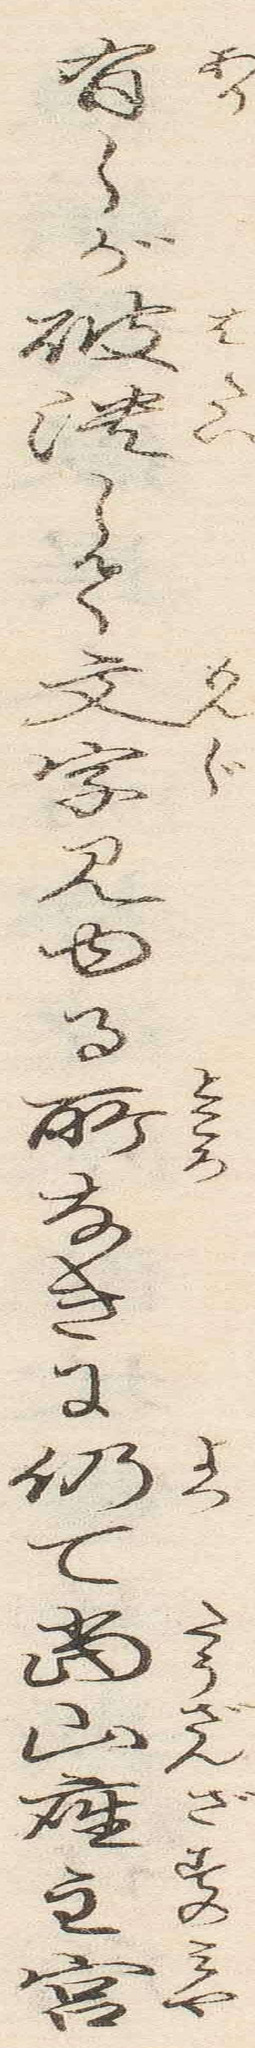有しが破潰して文字見ゆる所なきに仍て當山座主宮
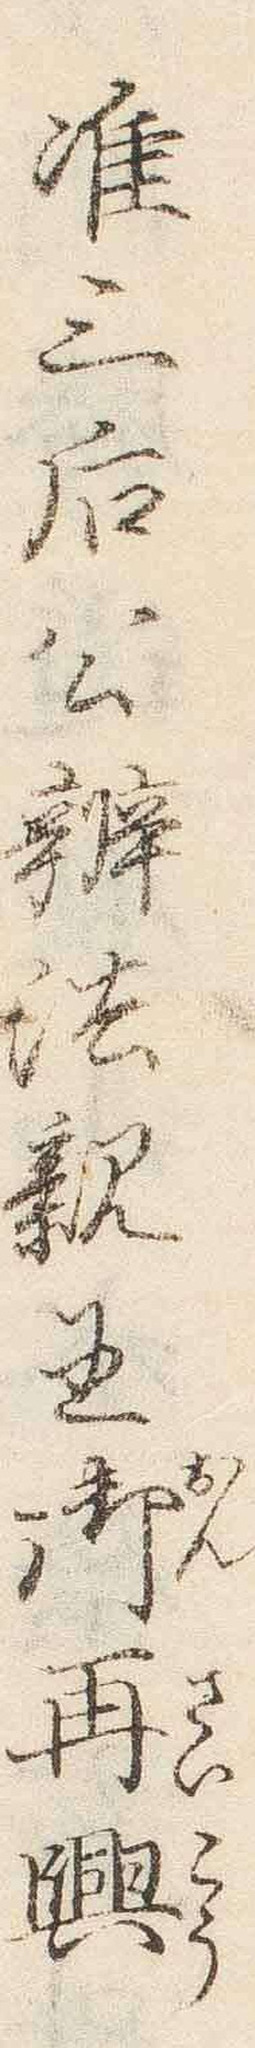准三后公辨法親王御再興
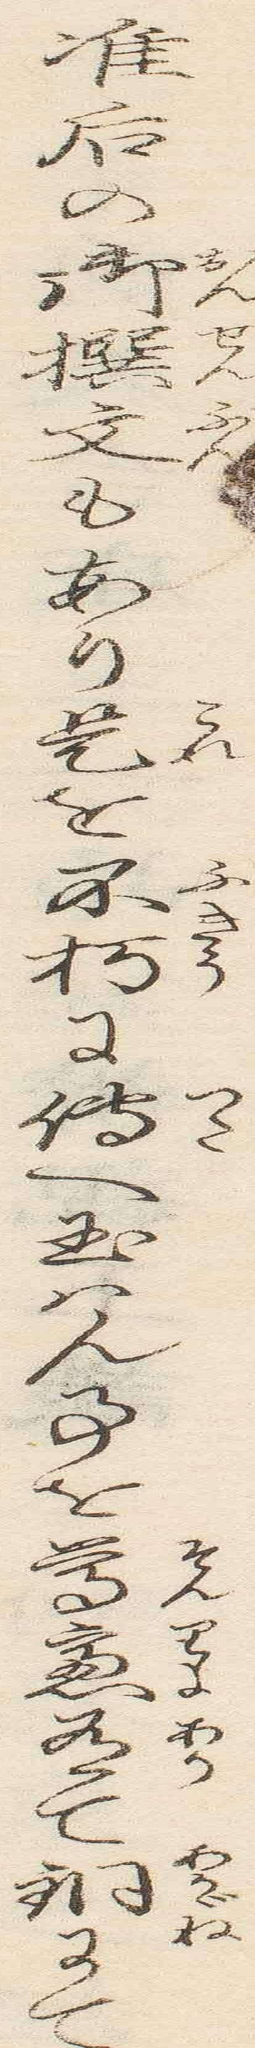准后の御撰文もあり是を不朽に傳へ玉はん事を尊慮有て銅にて
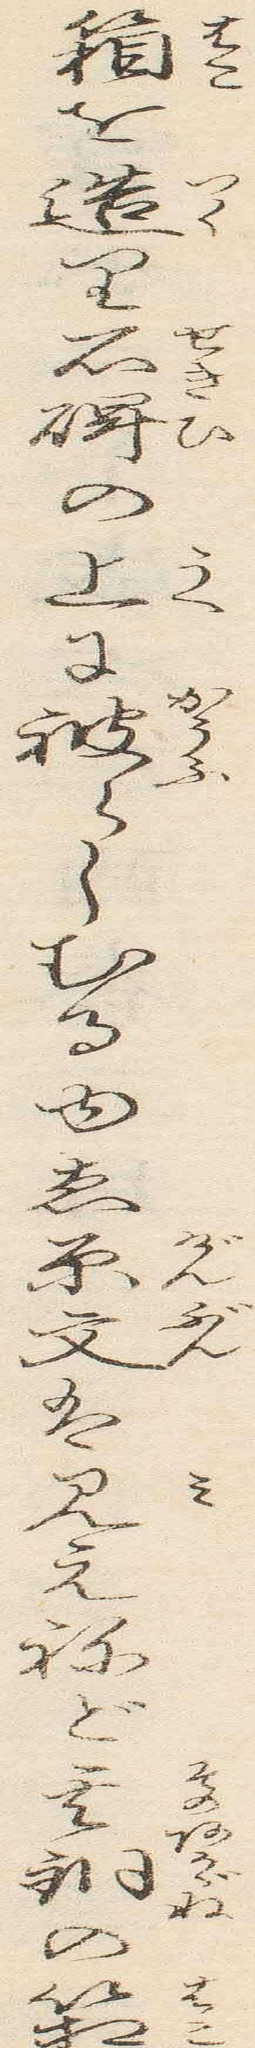箱を造り石碑の上に被らすむるゆゑ原文は見えねど其銅の箱
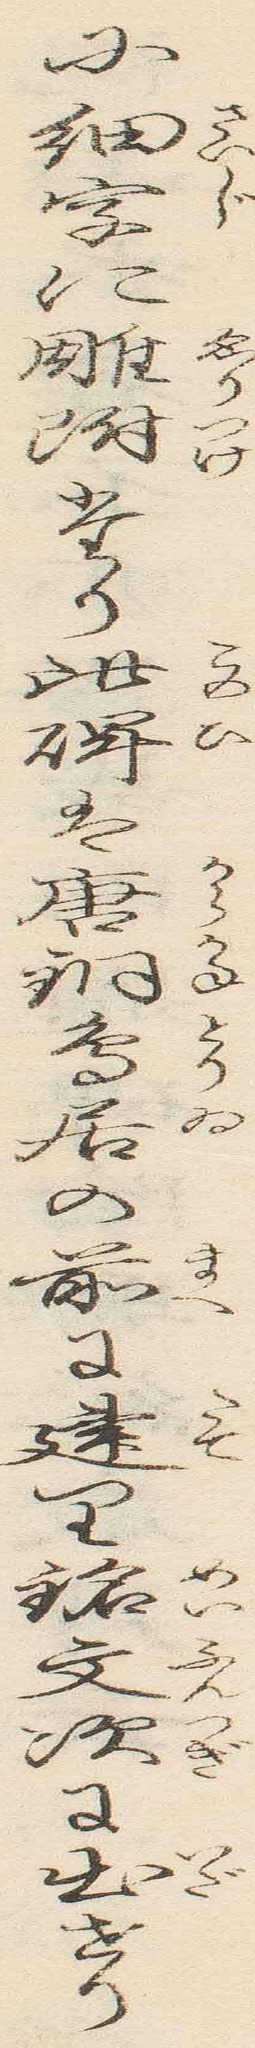に細字に雕附たり此碑は唐銅鳥居の前に建り銘文次に出せり
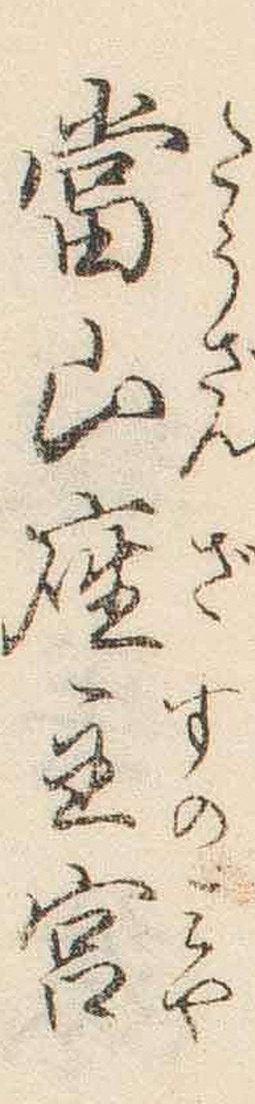當山座主宮
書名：日光山志
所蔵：東京学芸大学附属図書館 国文学研究資料館
